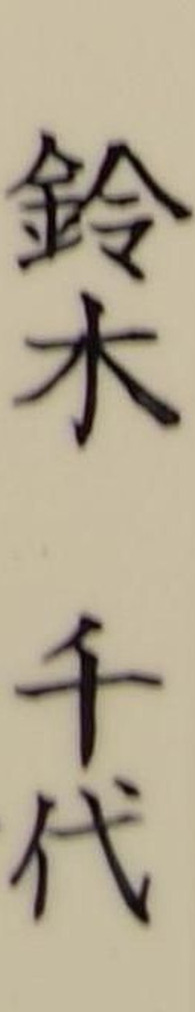鈴木千代
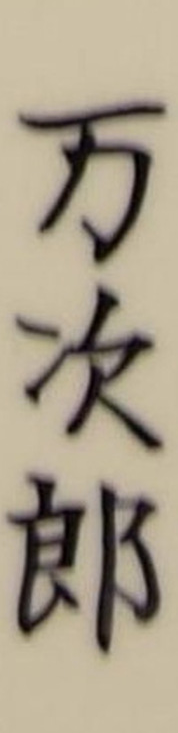万次郎
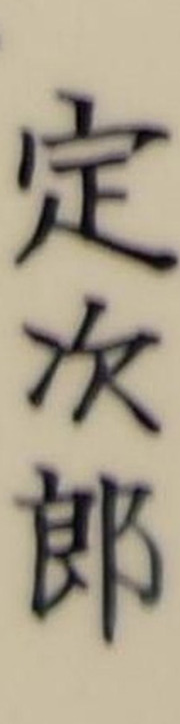定次郎
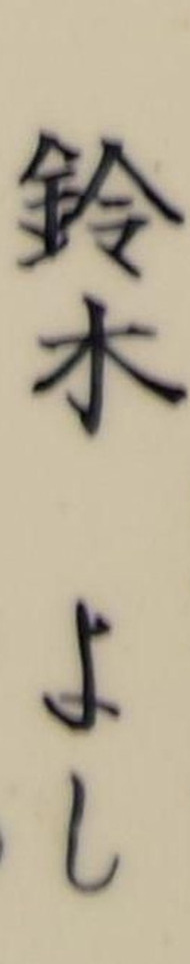鈴木よし

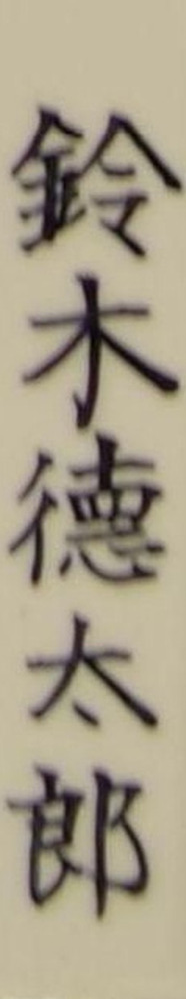鈴木徳太郎
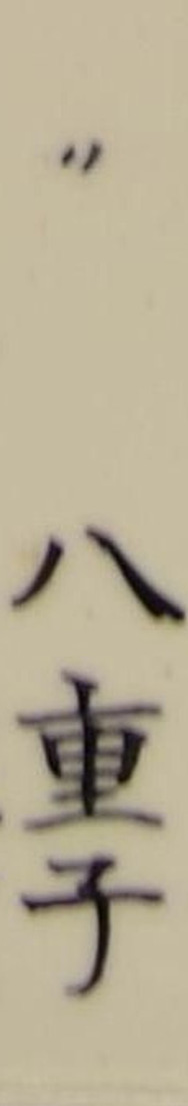八重子
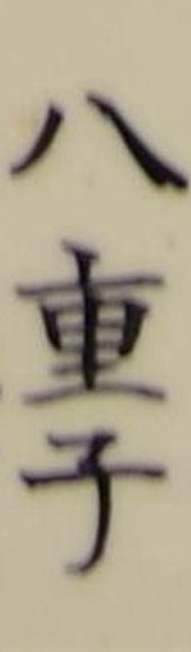八重子
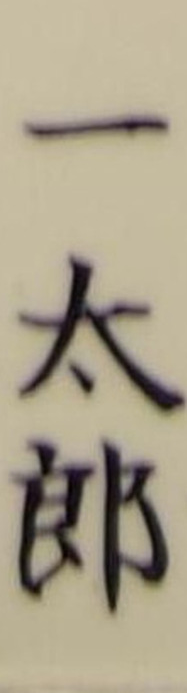一太郎
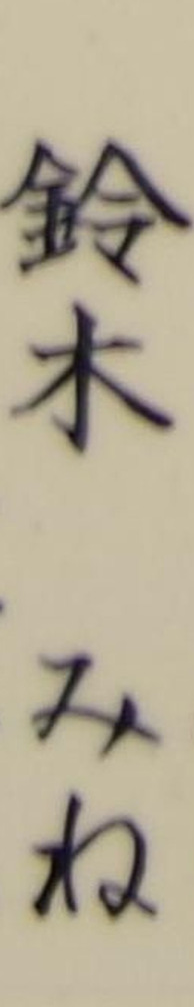鈴木みね
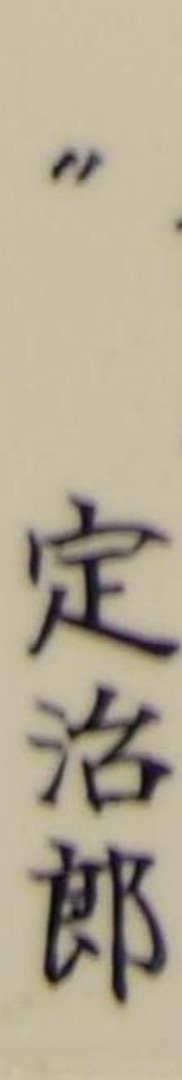定治郎
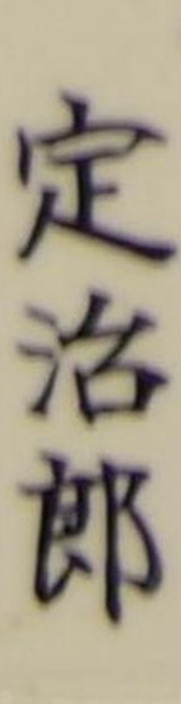定治郎
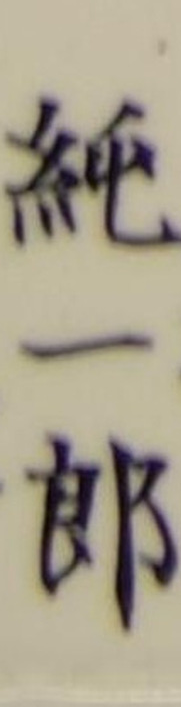純一郎

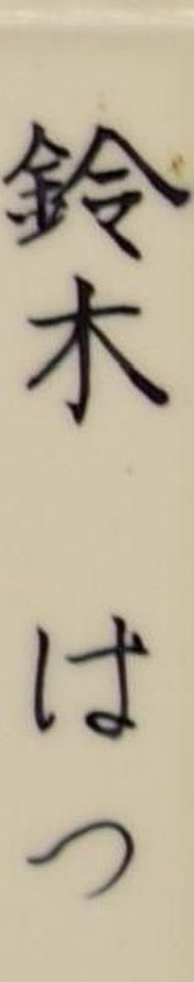鈴木はつ
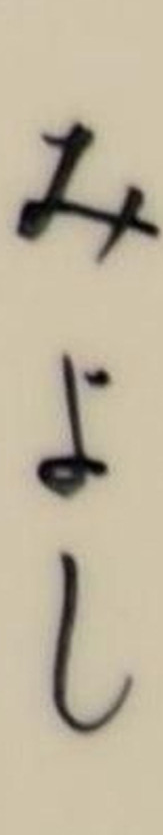みよし
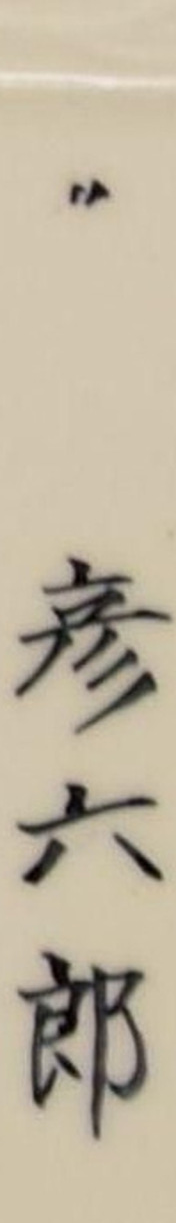彦六郎
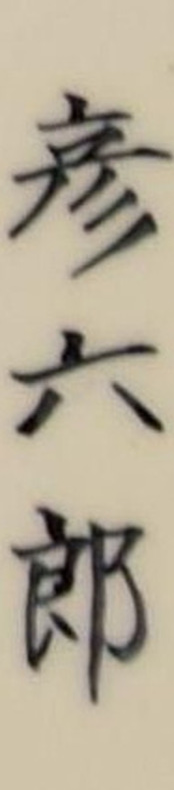彦六郎
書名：A~D
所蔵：koyasan kongobuji
